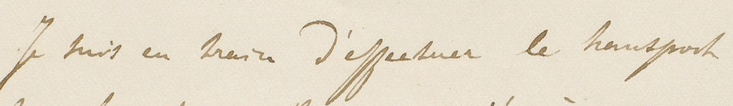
Je suis en train d'effectuer le transport
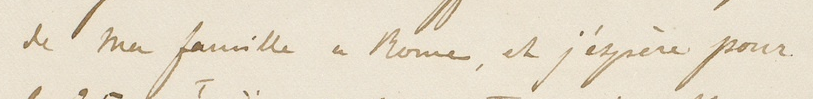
de ma famille a Rome, et j'éspère pour
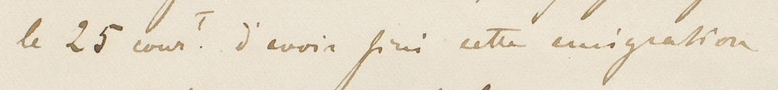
le 25 court d'avoir fini cette emigration
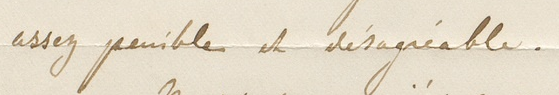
assez penible et désagréable.
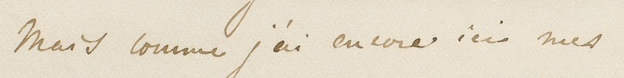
Mais comme j'ai encore ici mes
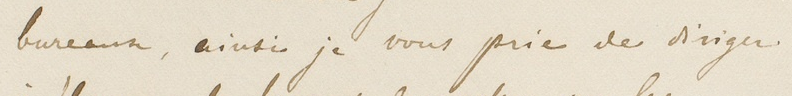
bureaux, ainsi je vous prie de diriger
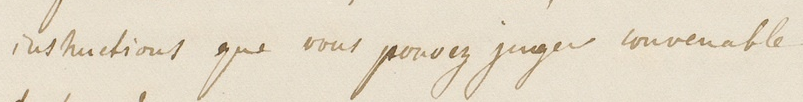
instructions que vous pouvez juger convenable
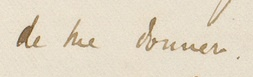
de me donner.
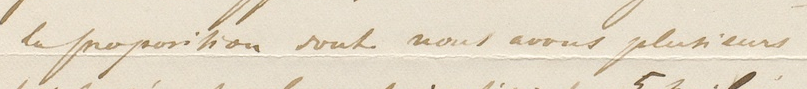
la proposition dont nous avons plusieurs
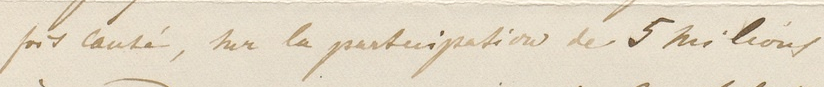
fois causé, sur la participation de 5 milions
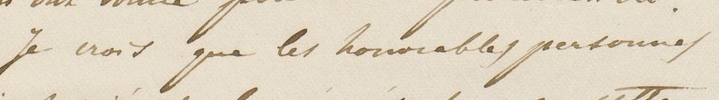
Je crois que les honobrables personnes
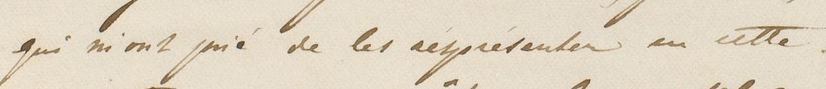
qui m'on prié de les résprésenter en cette
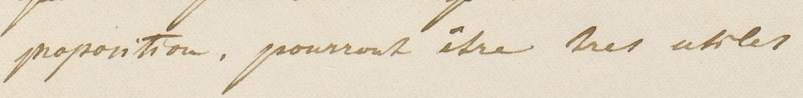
proposition, pourront être tres utiles
